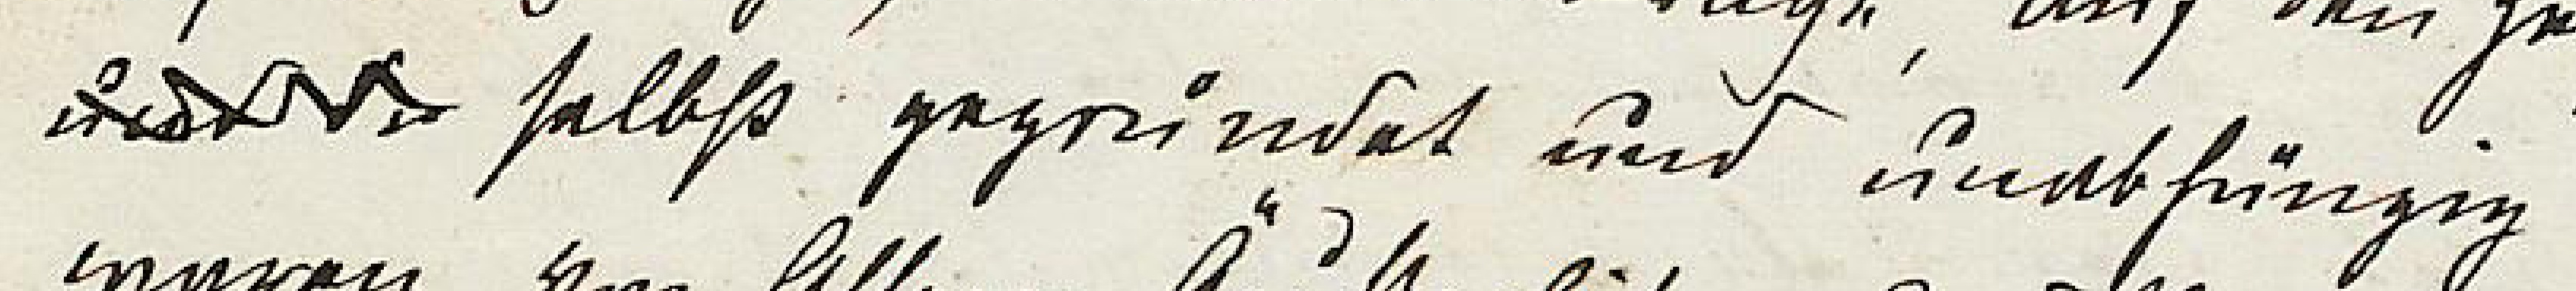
und da selbst gegründet und unabhängig
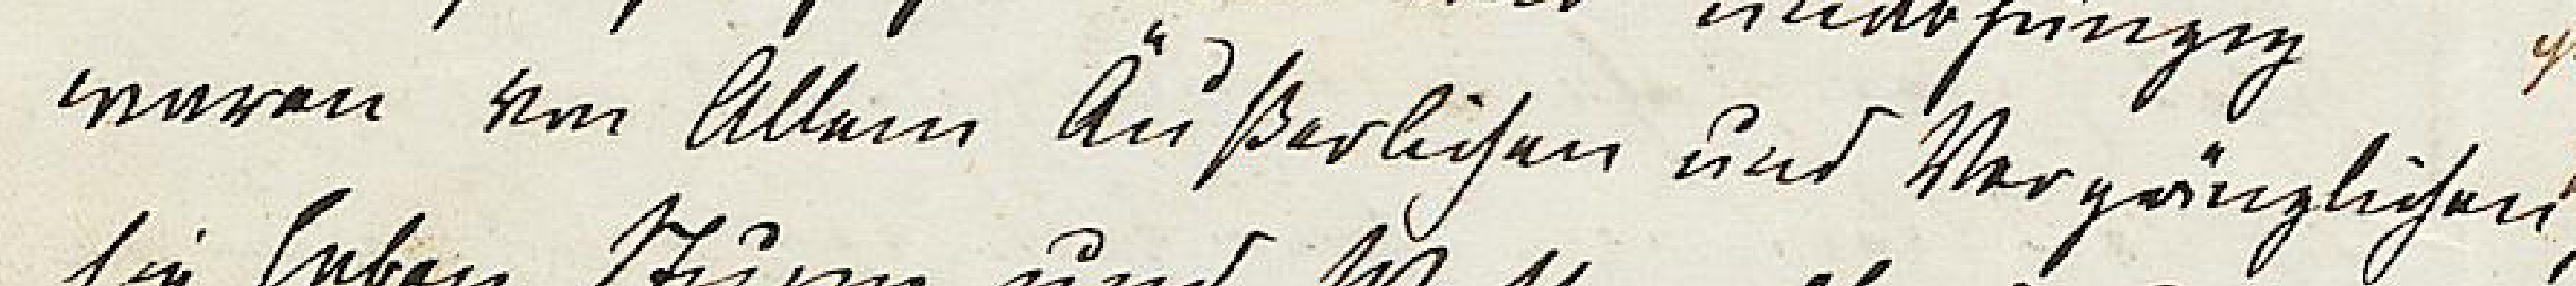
waren von Allem Äußerlichen und Vergänglichen
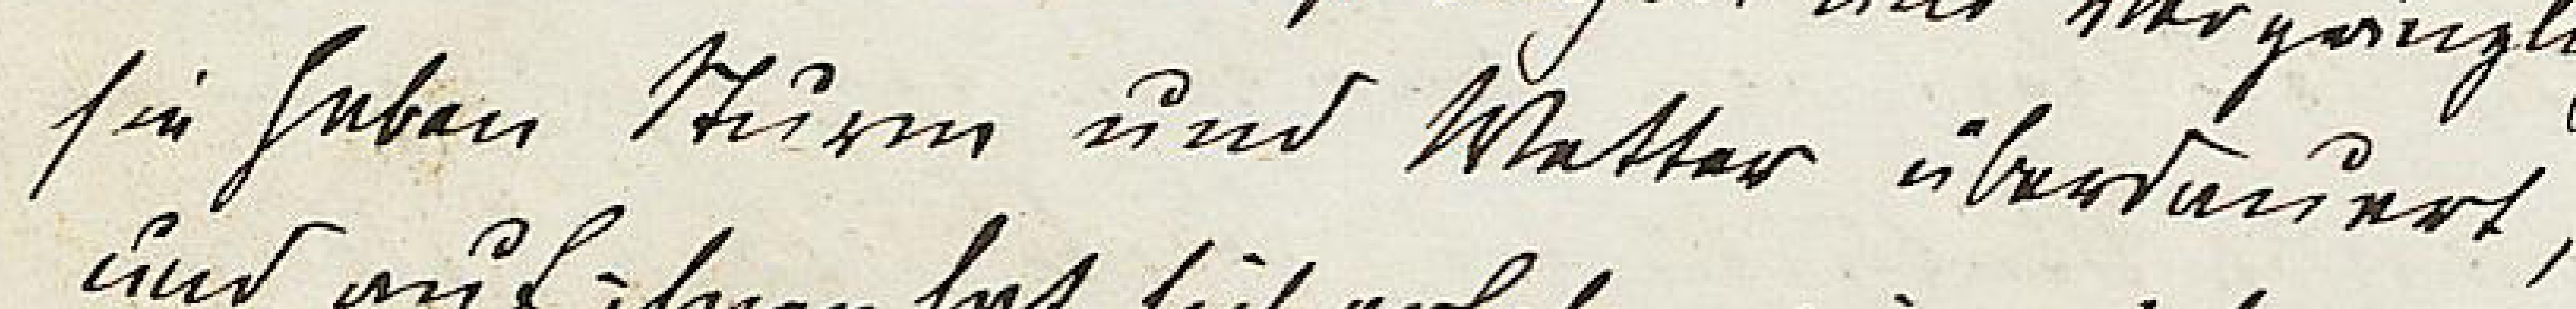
sie haben Sturm und Wetter überdauert
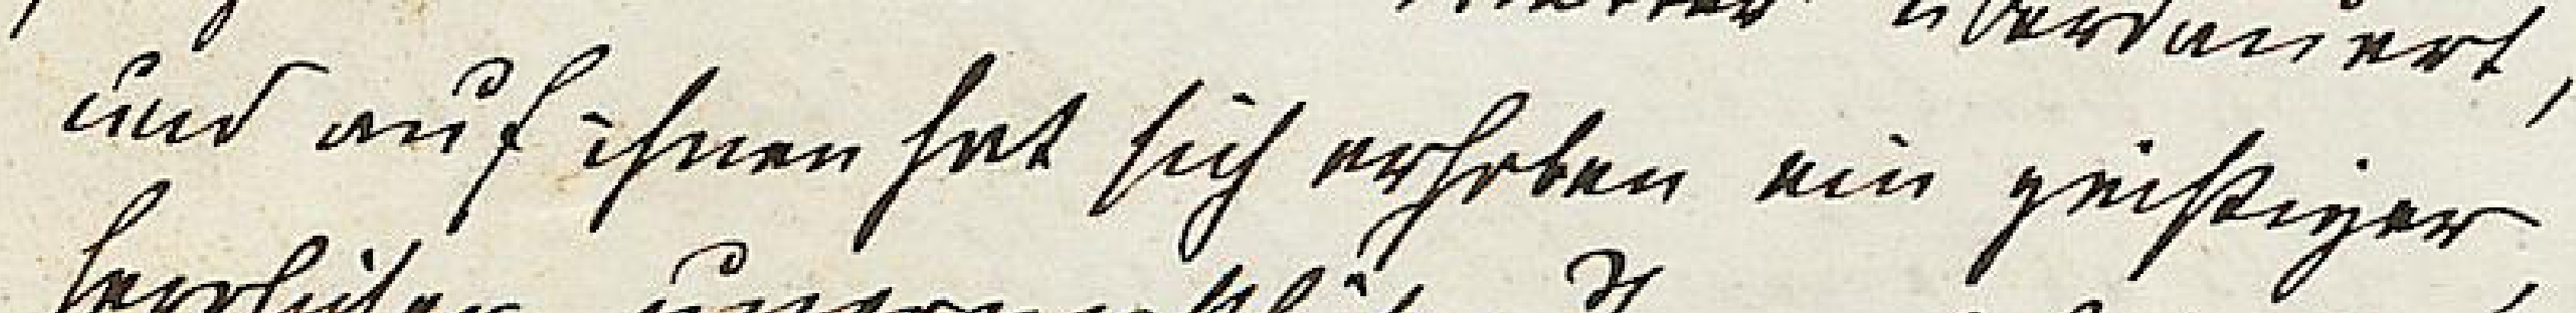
und auf ihnen hat sich erhoben ein geistiger
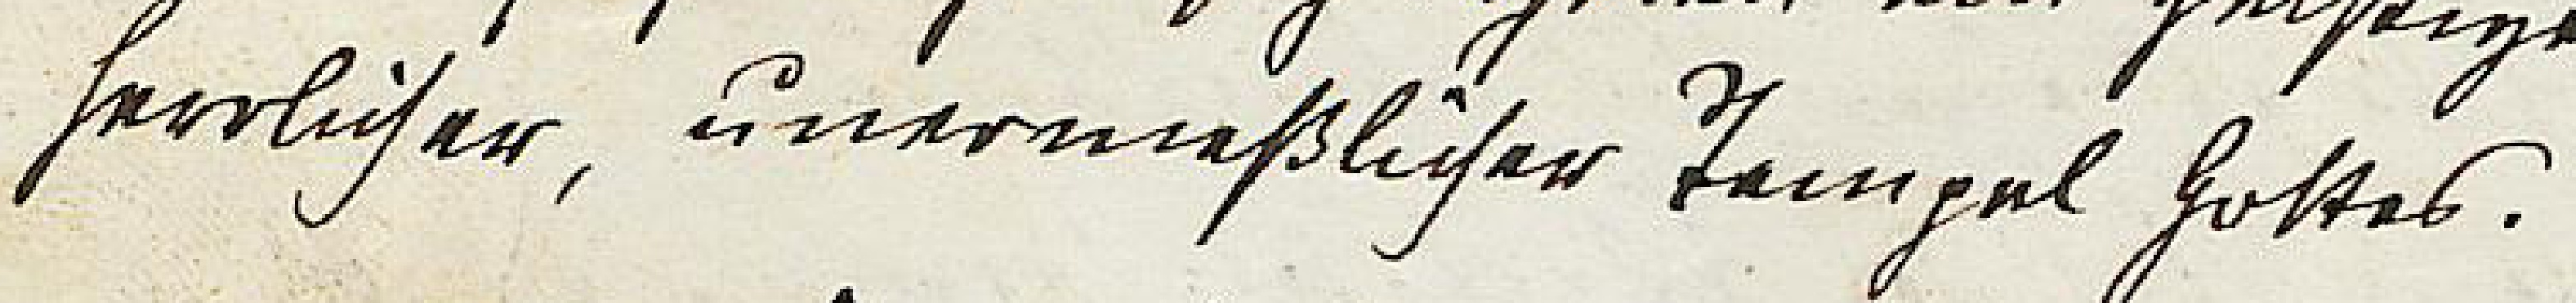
herrlicher, unermeßlicher Tempel Gottes.
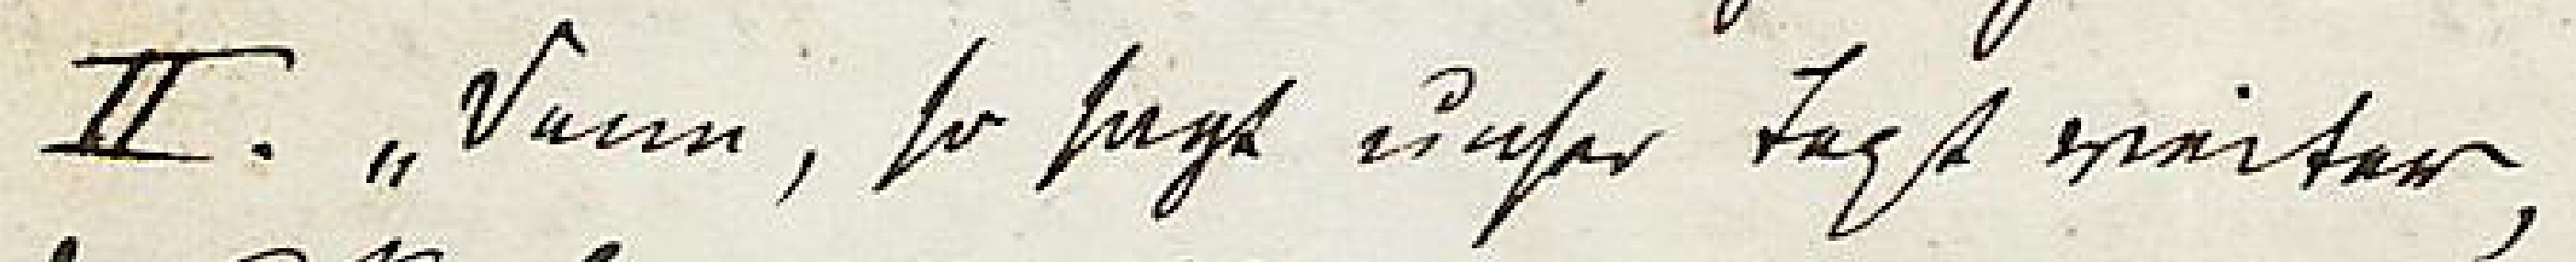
II. "Denn, so sagt unser Text weiter,
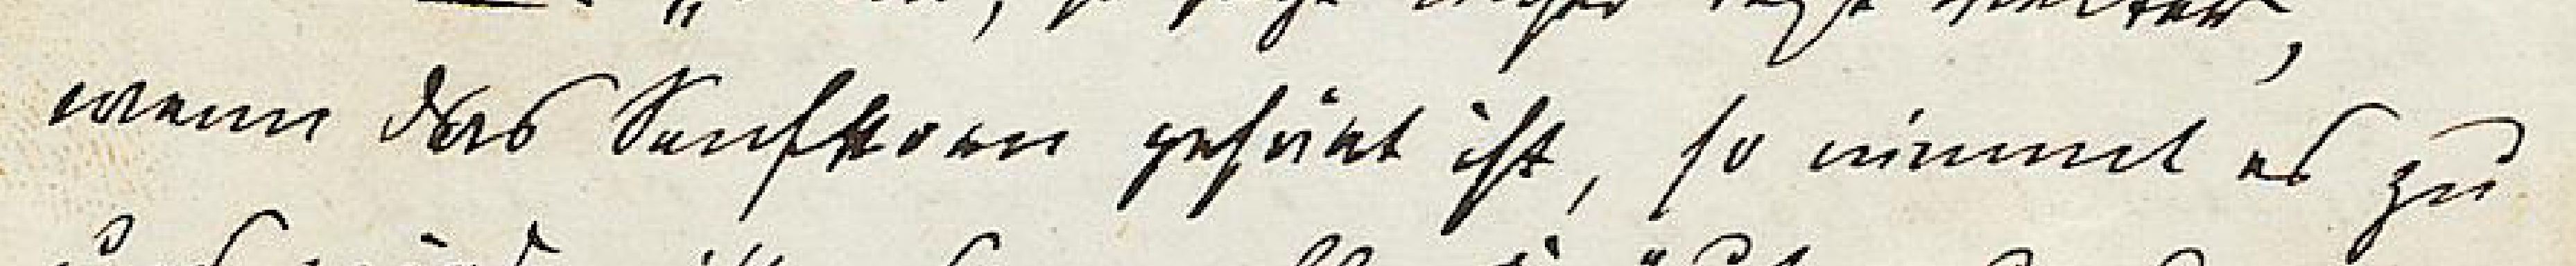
wenn das Senfkorn gesäet ist, so einmal es zu
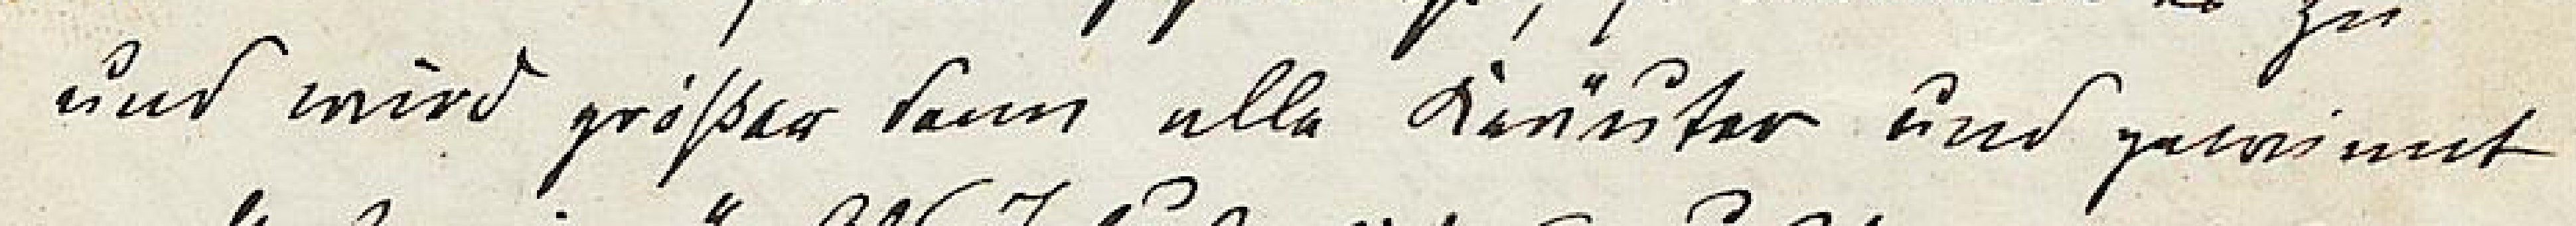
uns wird größer denn alle Kräuter und gewinnt
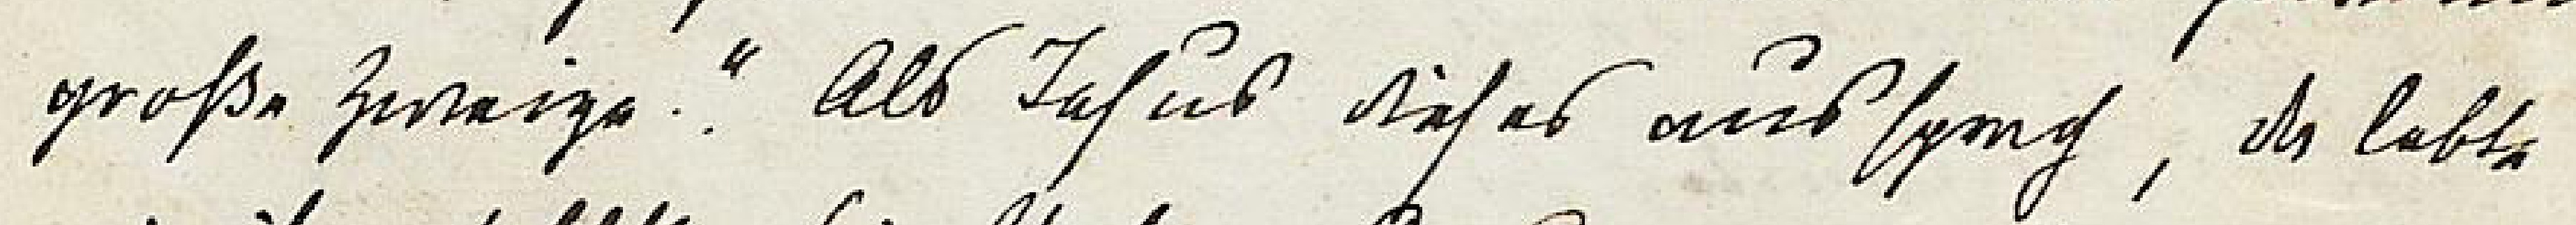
große Zweige." Als Jesus dieses aussprach, da lebte
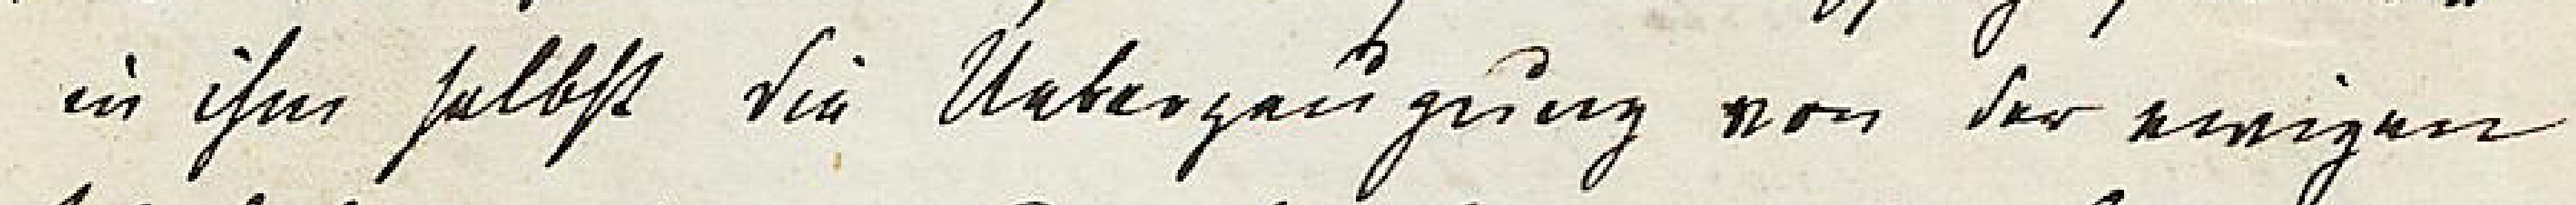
in ihm selbst die Ueberzeugung von der ewigen
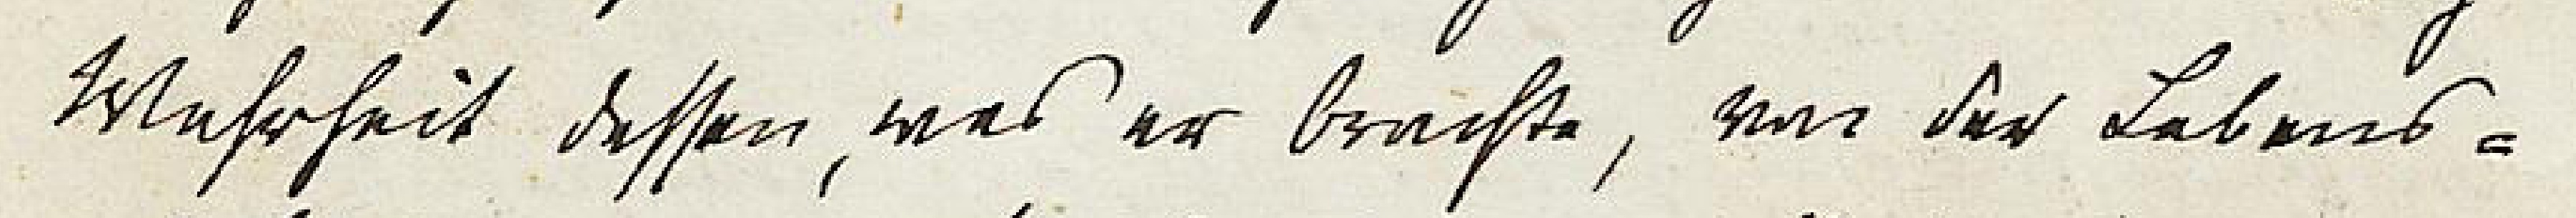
Wahrheit dessen, was er brachte, von der Lebens¬
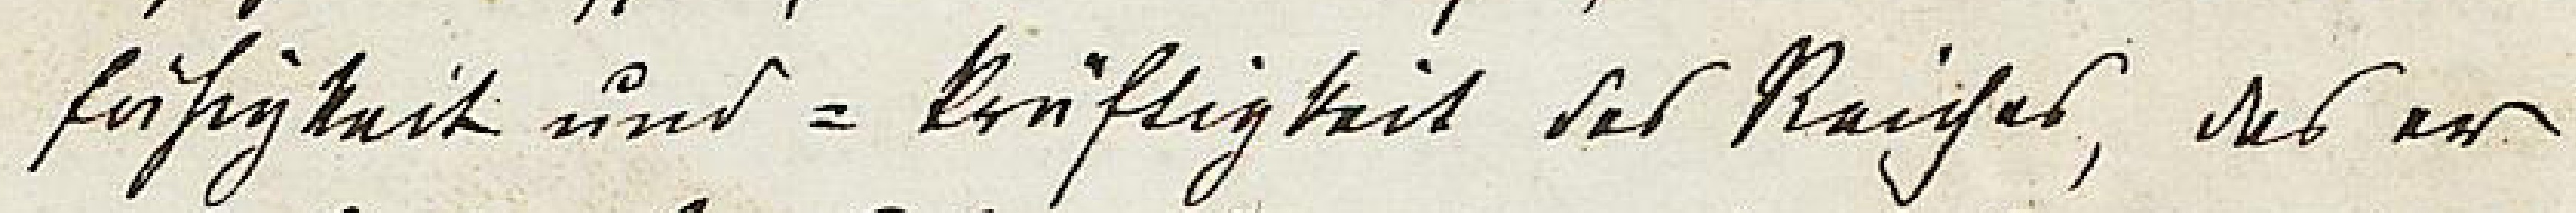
fähigkeit und -kräftigkeit des Reiches, das er
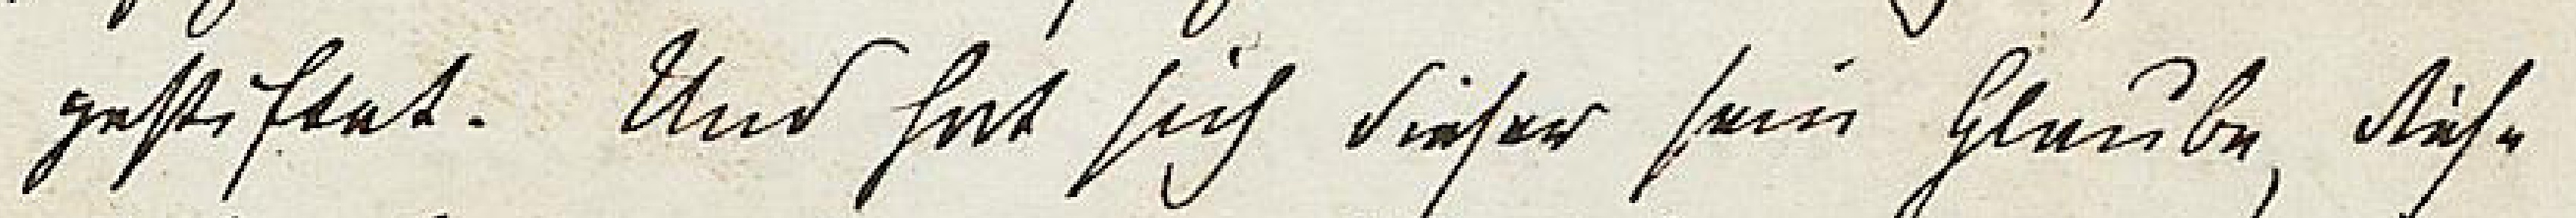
gestiftet. Und hat sich dieser sein Glaube, diese
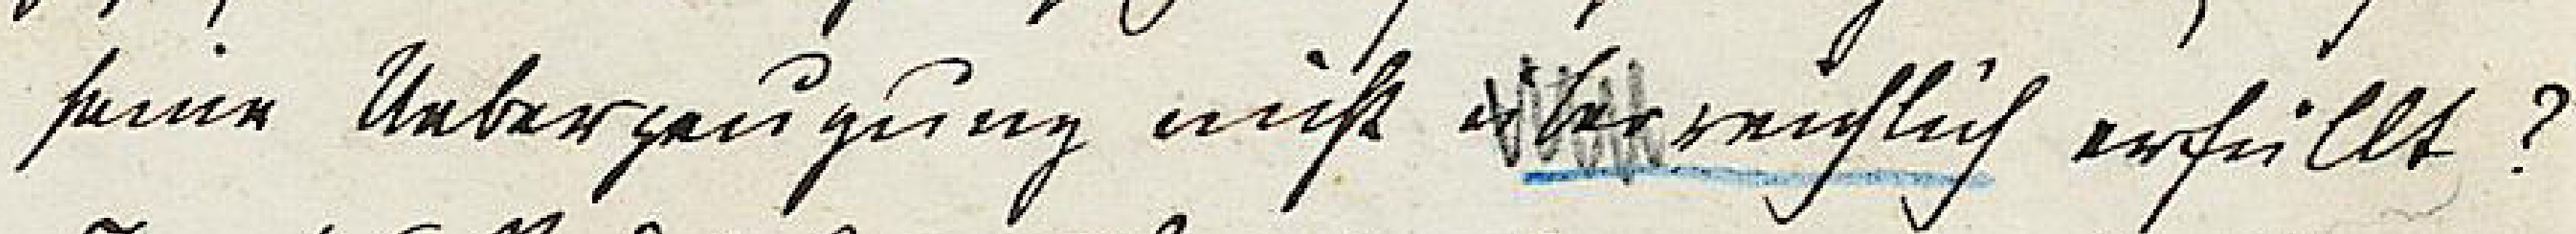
seine Ueberzeugung nicht überreichlich erfüllt?
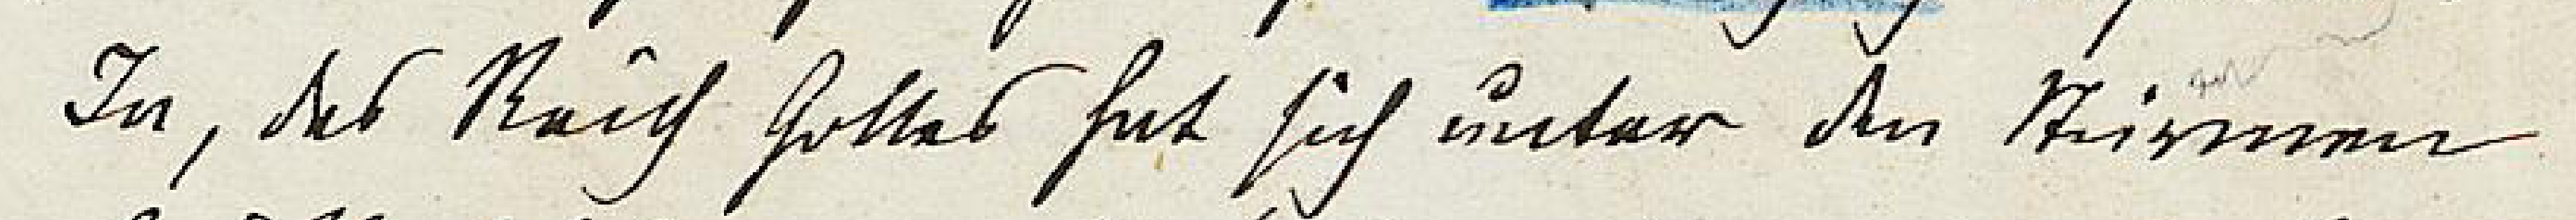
Ja, das Reich Gottes hat sich unter den Stürmen
